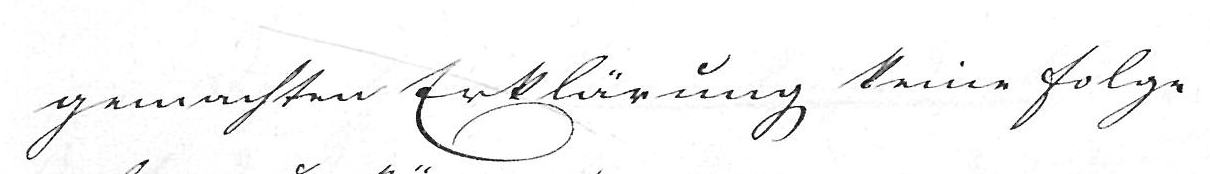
gemachten Erklärung keine Folge
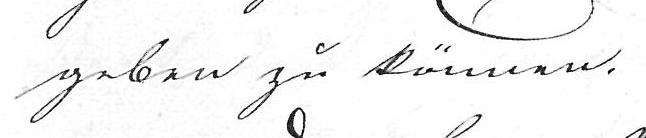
geben zu können.
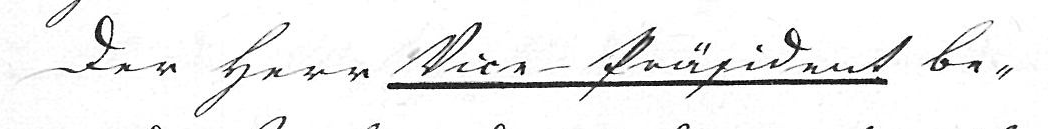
Der Herr Vice-Präsident be-
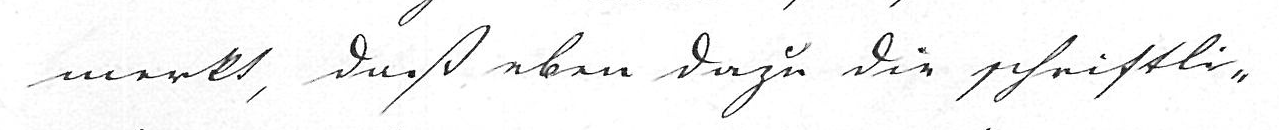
merkt, daß eben dazu die schriftli-
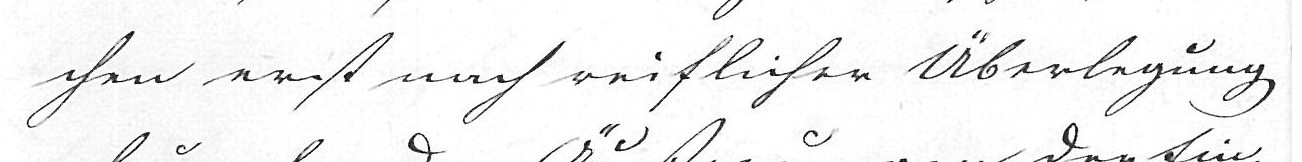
chen erst nach reiflicher Überlegung
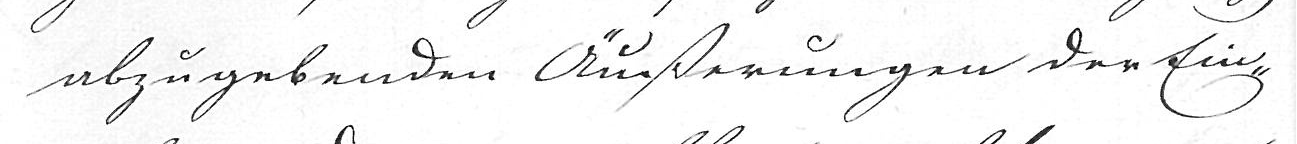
abzugebenden Äußerungen der Ein-
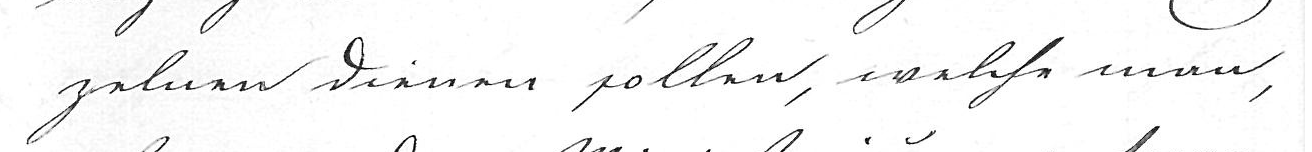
zelnen dienen sollen, welche man,
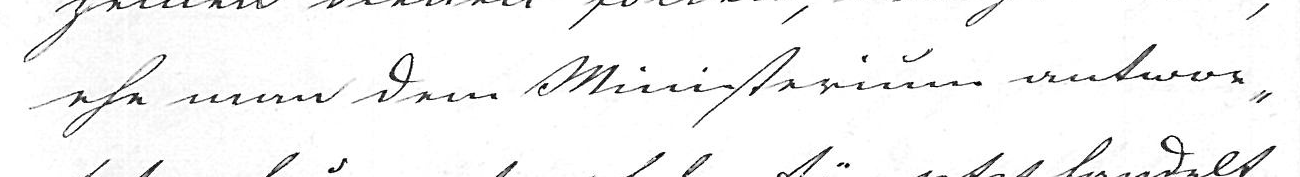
ehe man dem Ministerium antwor-
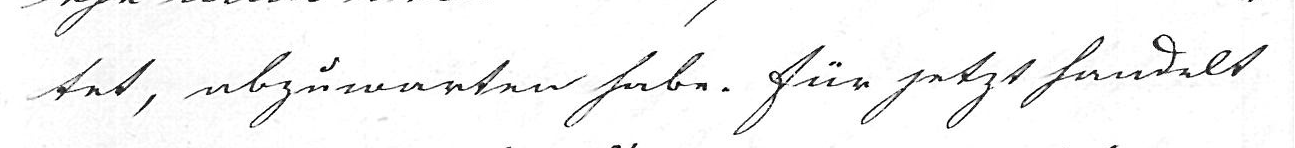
tet, abzuwarten habe. Für jetzt handelt
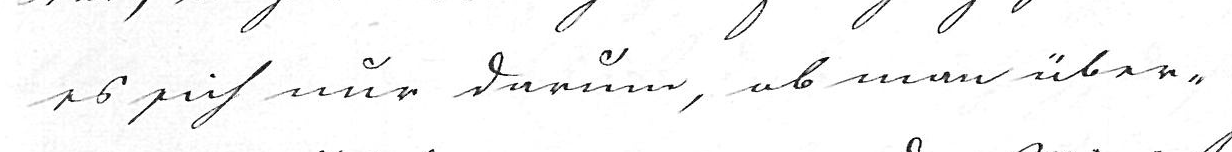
es sich nur darum, ob man über-
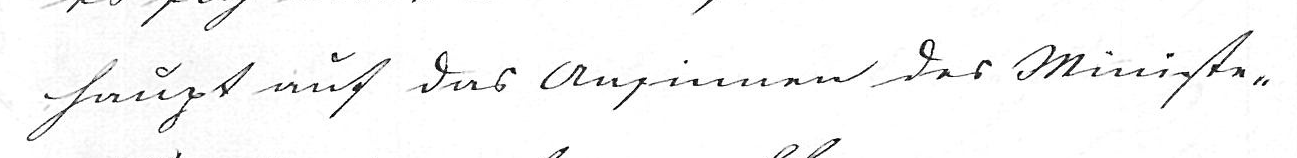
haupt auf das Ansinnen des Ministe-
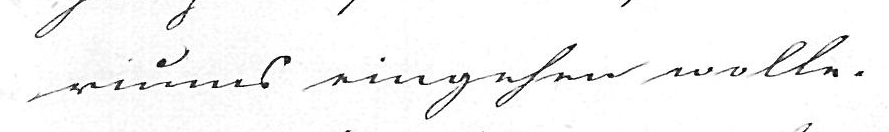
riums eingehen wolle.
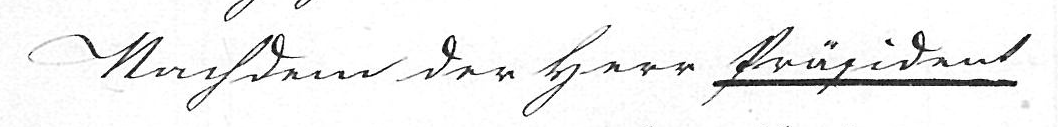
Nachdem der Herr Präsident
